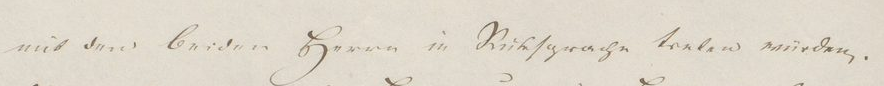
mit den beiden Herrn in Rüksprache treten würden.
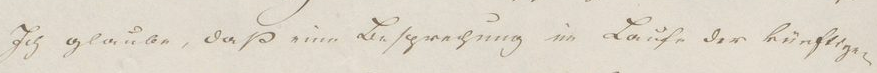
Ich glaube, daß eine Besprechung im Laufe der künftigen
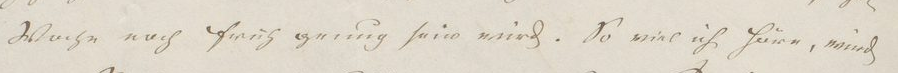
Woche noch früh genug sein wird. So viel ich höre, wird
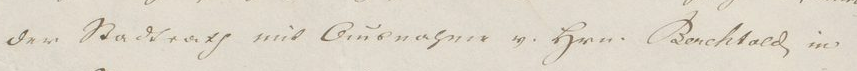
der Stadtrath mit Ausnahme v. Hrn. Berchtold in
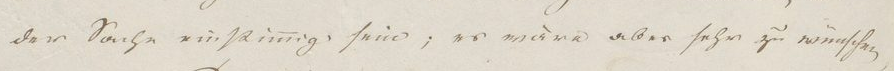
der Sache einstimmig sein; es wäre aber sehr zu wünschen,
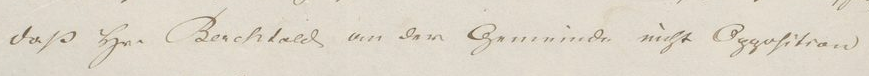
daß Hr. Berchtold an der Gemeinde nicht Opposition
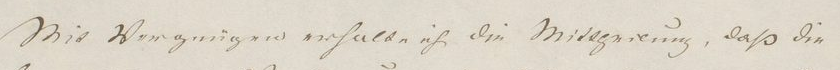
Mit Vergnügen erhalte ich die Mittheilung, daß die
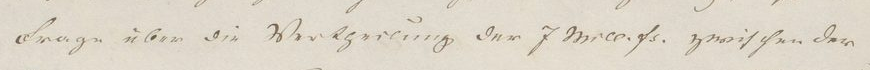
Frage über die Vertheilung der 7 Mill. fs. zwischen der
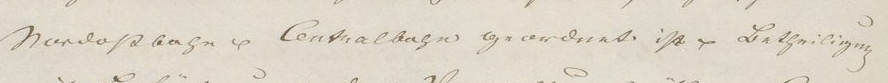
Nordostbahn & Centralbahn geordnet ist & Betheiligung
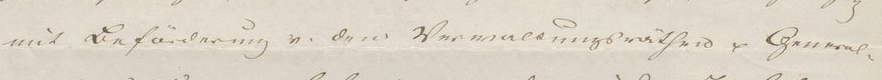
mit Beförderung v. den Verwaltungsräthen & General-
